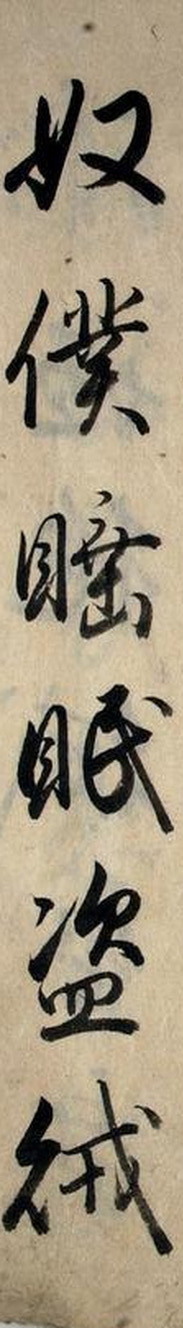奴僕睡眠盗賊

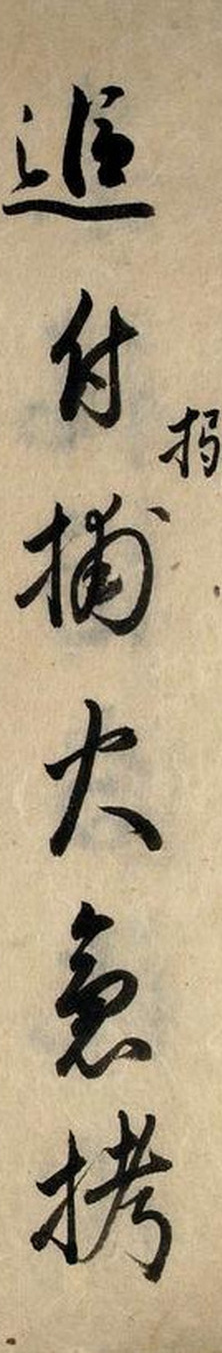追付搦捕火急拷
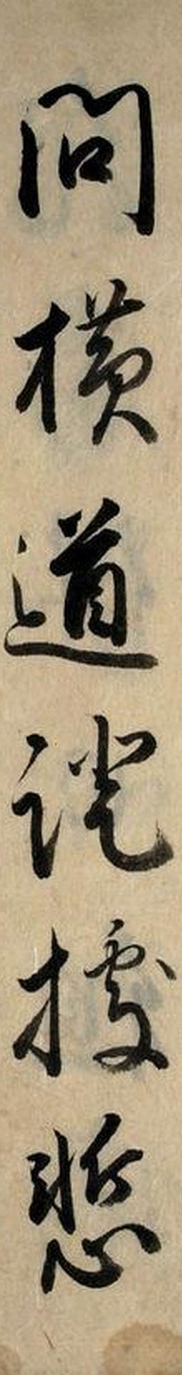問横道証拠慚
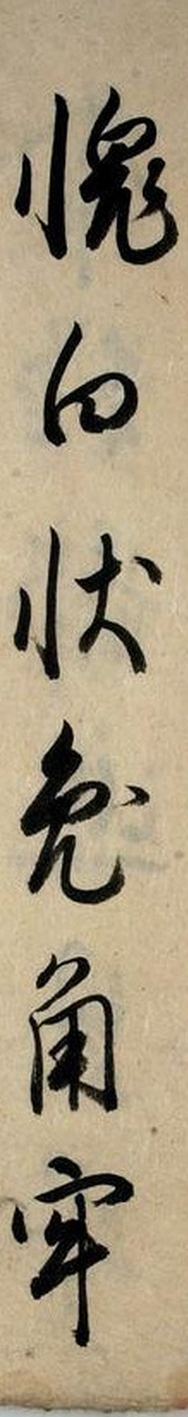愧白状兎角牢
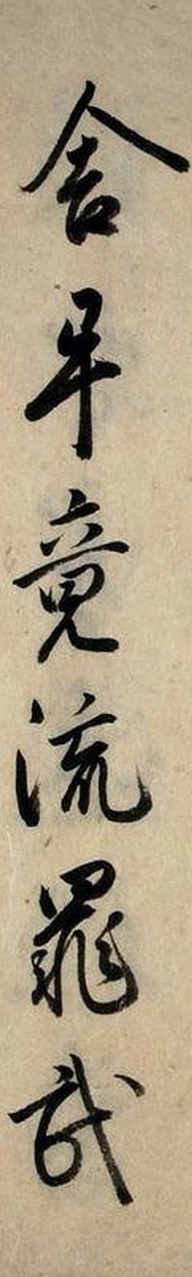舎畢竟流罪武
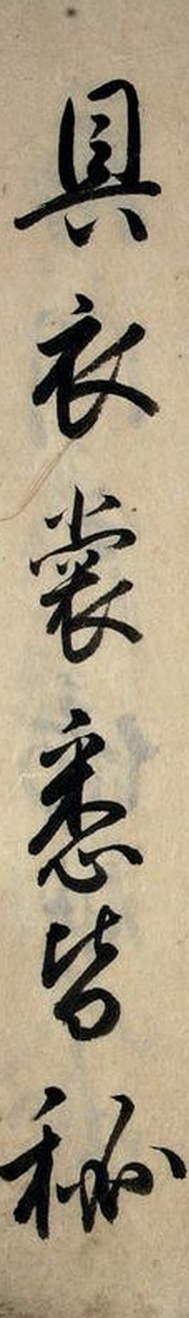具衣裳悉皆秘

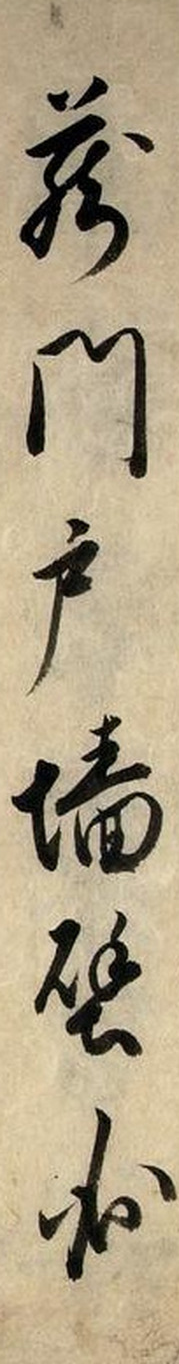蔵門戸牆壁必
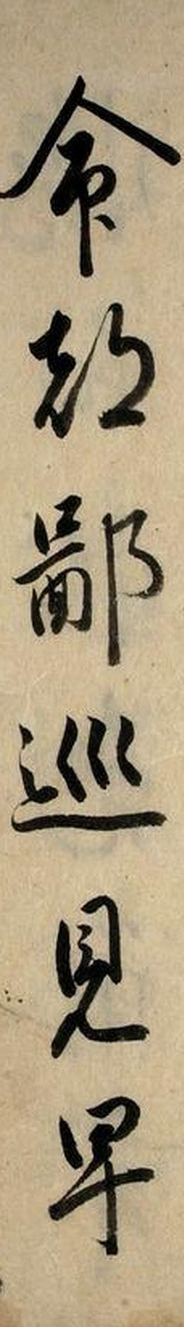命都鄙巡見早
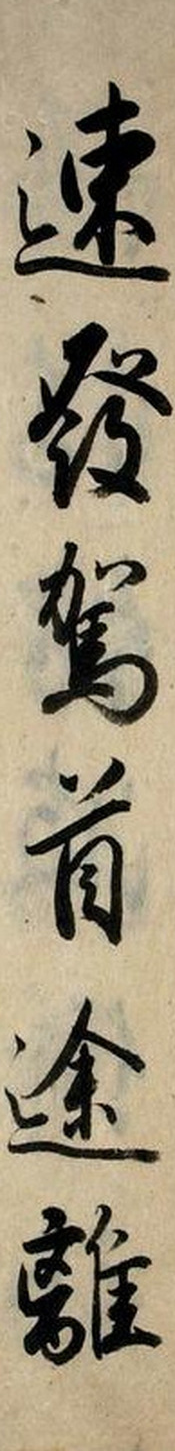速発駕首途離
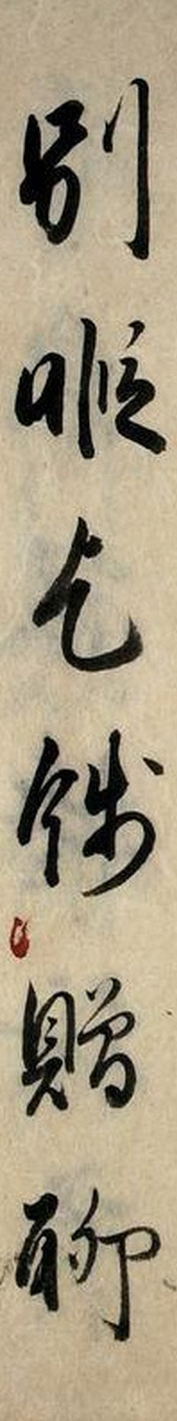別暇乞餞贈聊

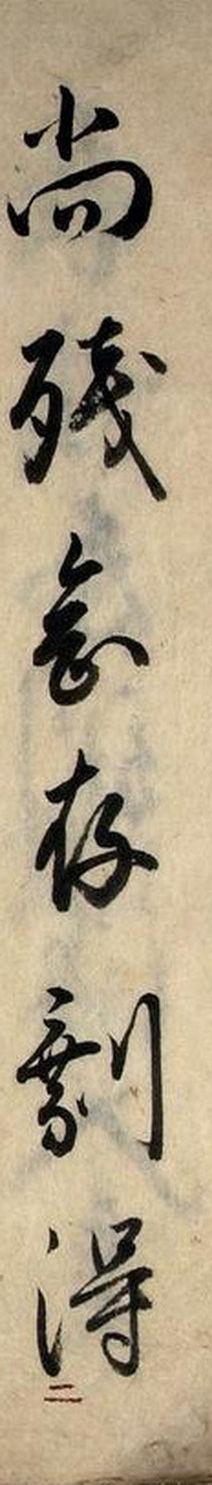尚残念存剰得
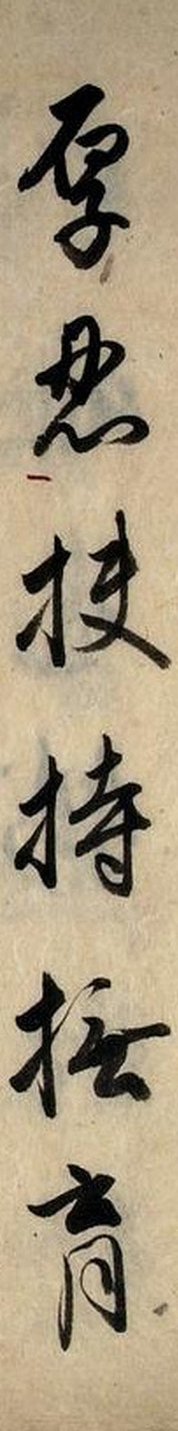厚恩扶持撫育
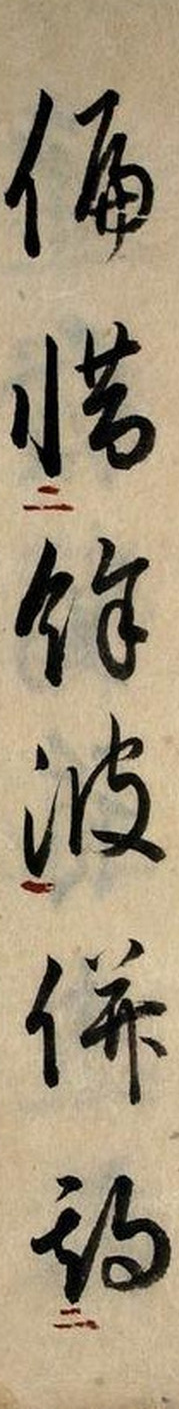偏惜余波併期
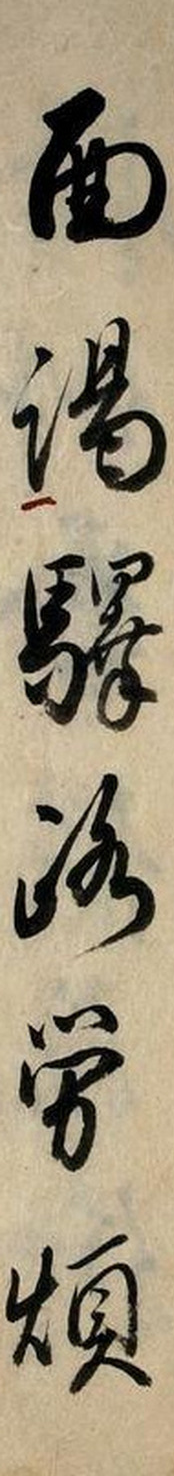面謁駅路労煩
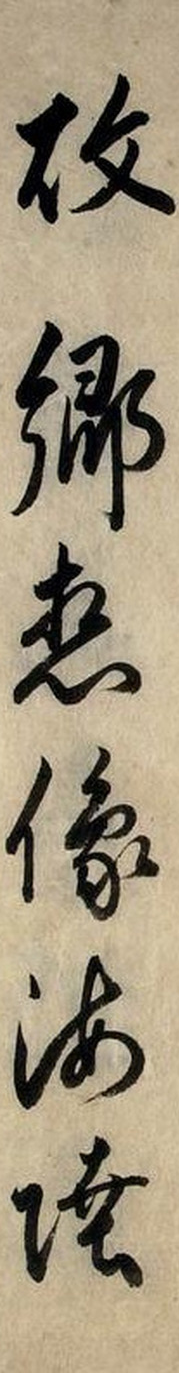故郷想像海陸
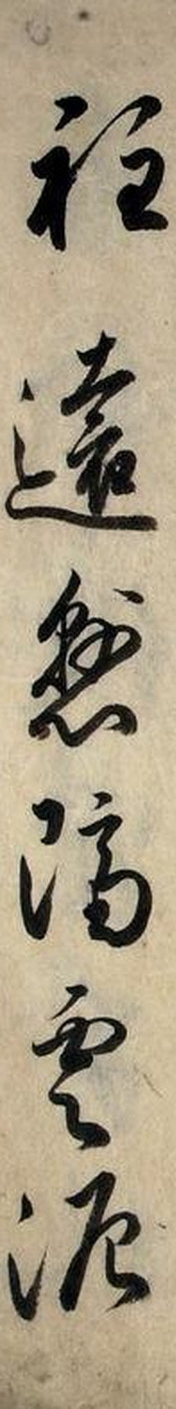程遠懸隔雲泥
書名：世話千字文（手習手本）
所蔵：福井県文書館 Fukui Prefectural Archives
